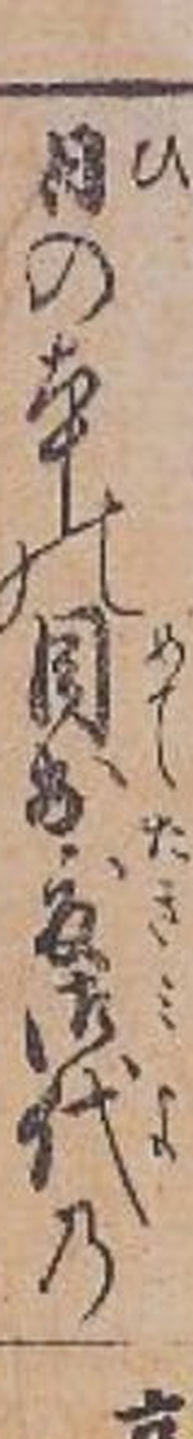日の本の目出度御代の
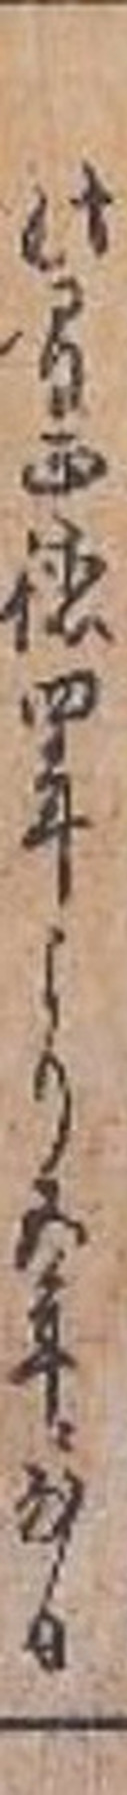此間正徳五年より五年になる
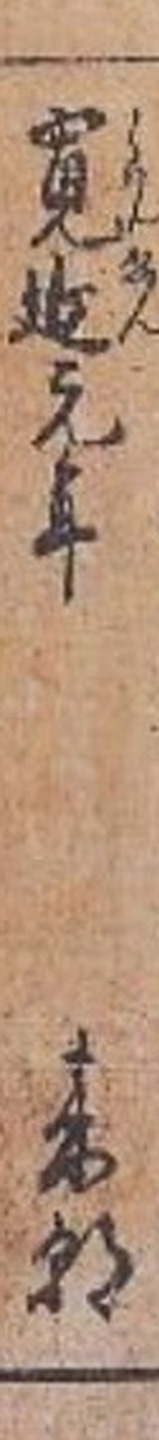寛延元年来朝
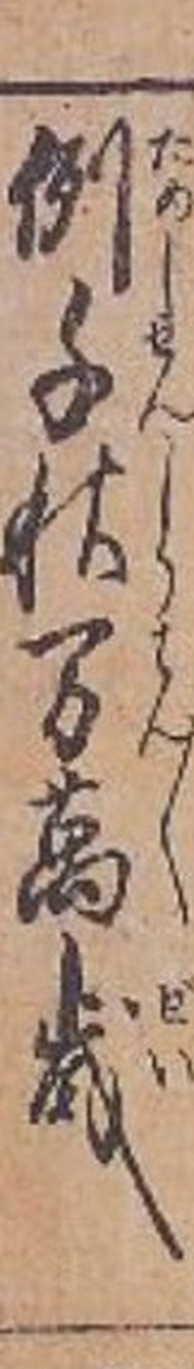例千秋万萬歳
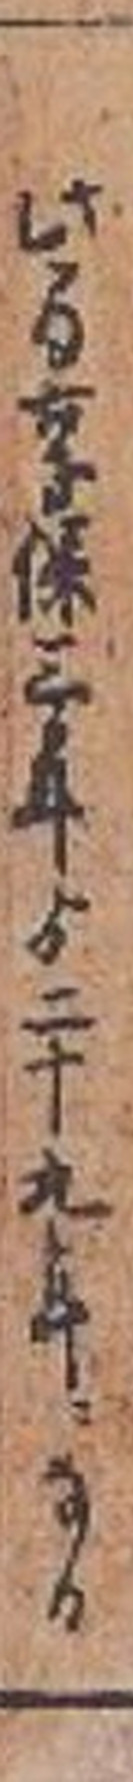此間享保三年より二十九年になる

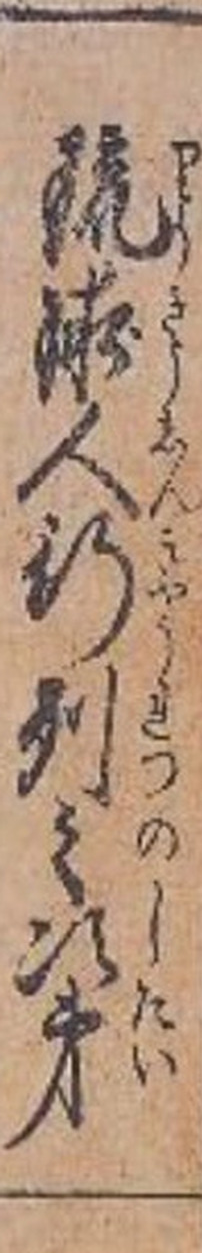琉球人行列之次第
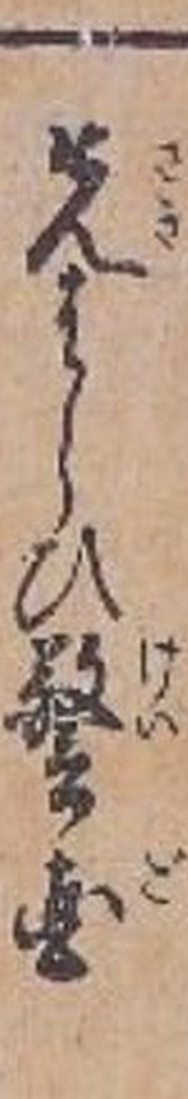先はらひ警固
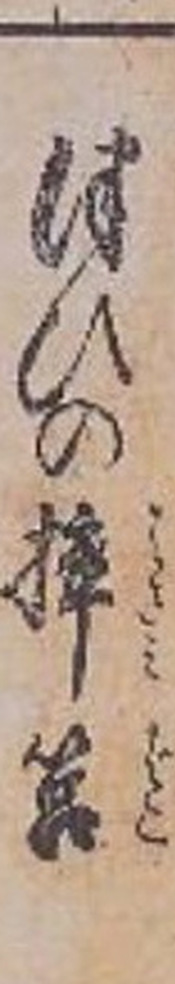つひの挟箱
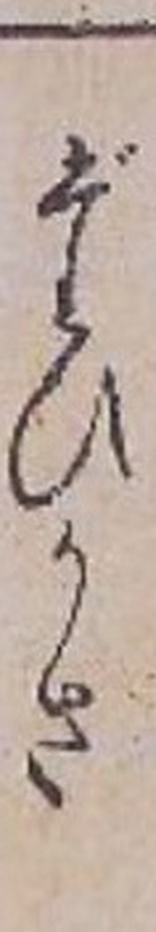だひかさ
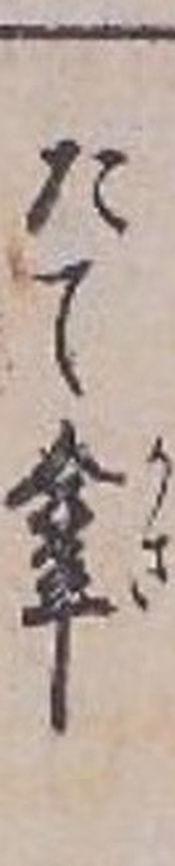たて傘
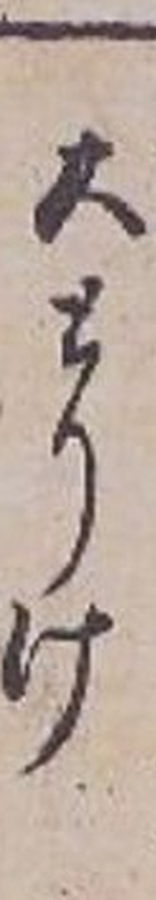大とりけ
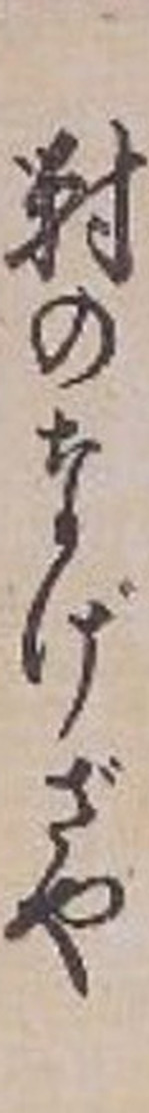對のなげざや
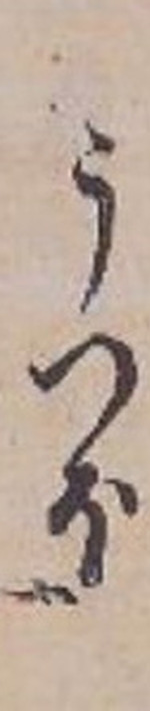うつほ

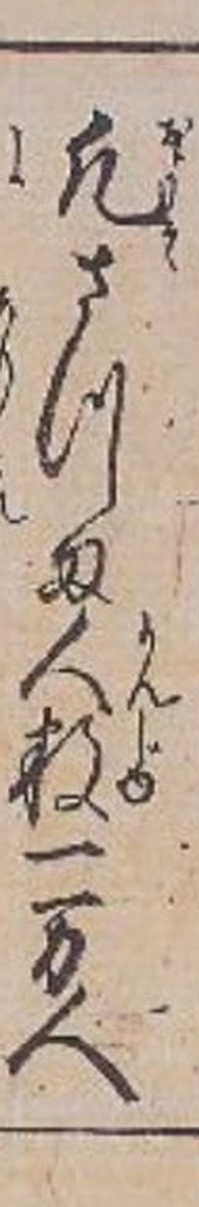凡さつま人数一万人
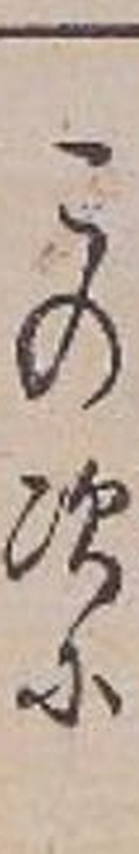この次に
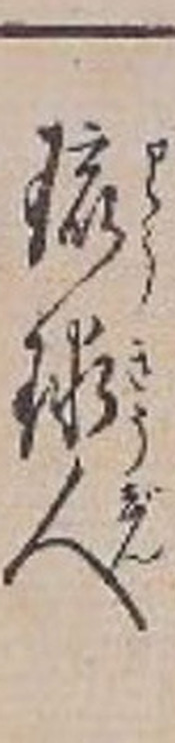琉球人
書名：琉球人大行列記 大全 来朝新板絵入
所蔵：University of the Ryukyus Library
